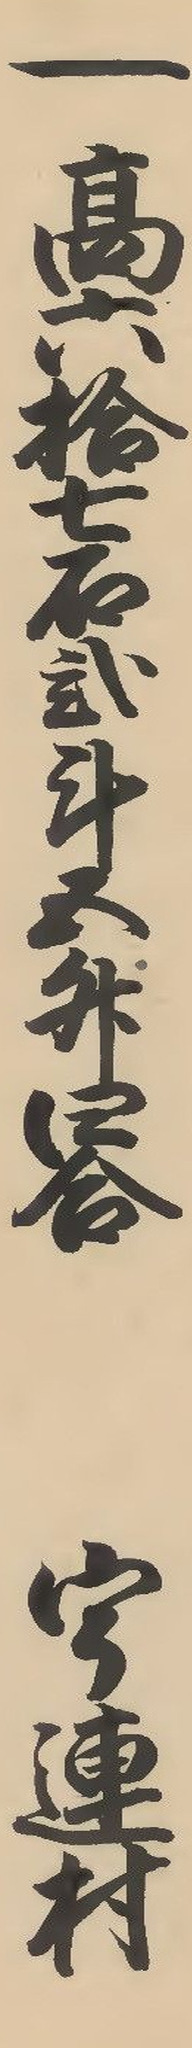一高六拾七石弐斗五升四合宇連村
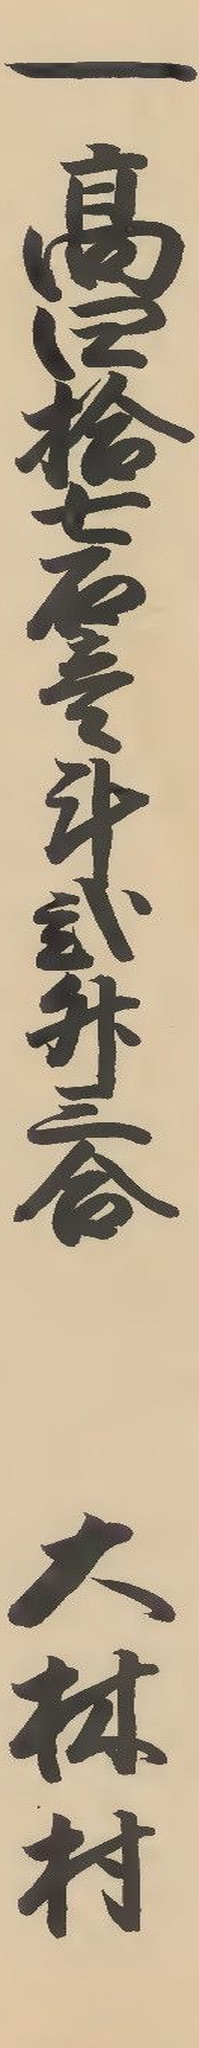一高四拾七石壱斗弐升三合大林村
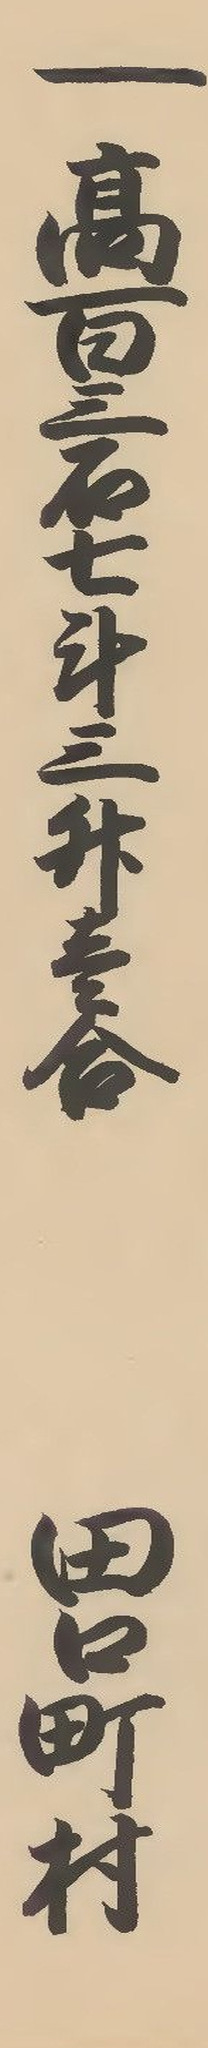一高百三石七斗三升壱合田口町村
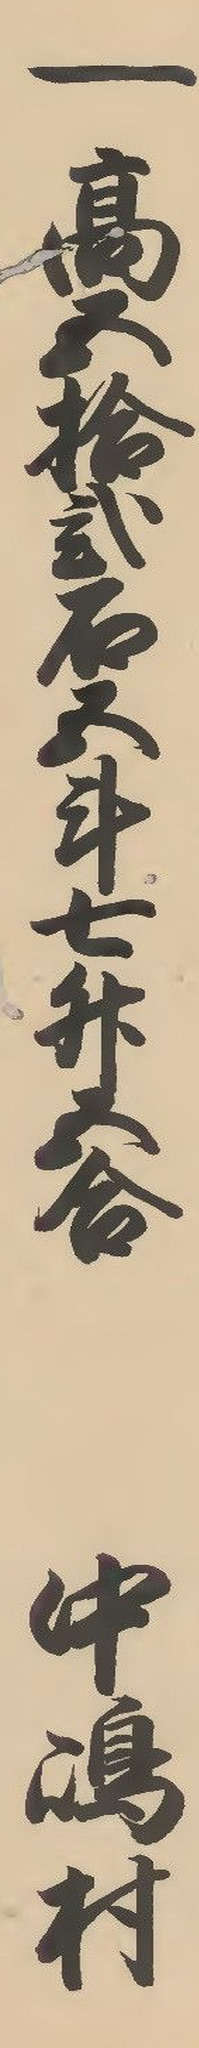一高五拾弐石五斗七升五合中島村
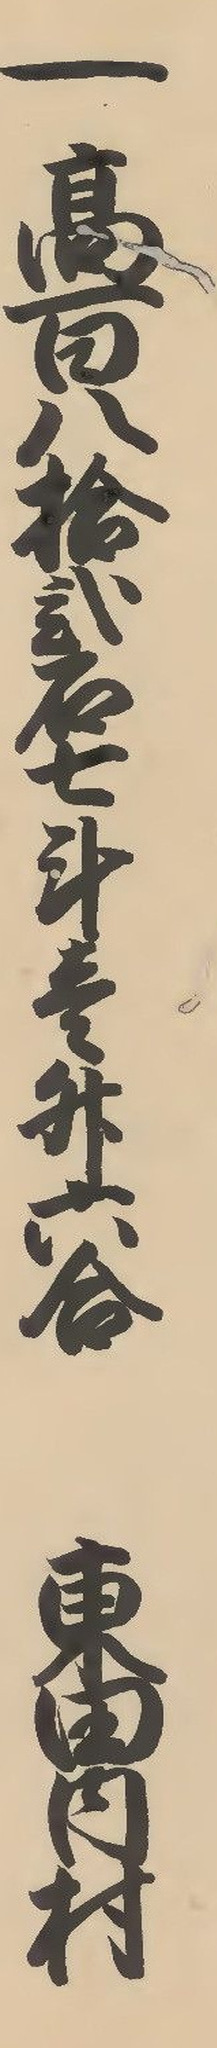一百八拾弐石七斗壱升六合東田内村
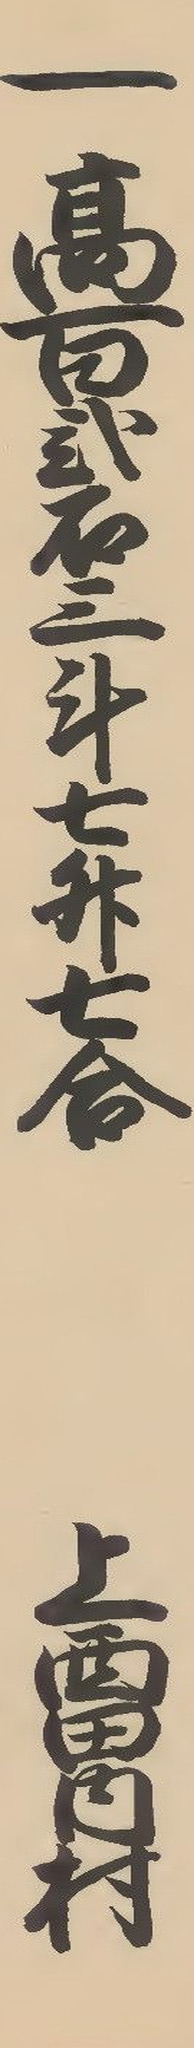一高百弐石三斗七升七合上西田内村
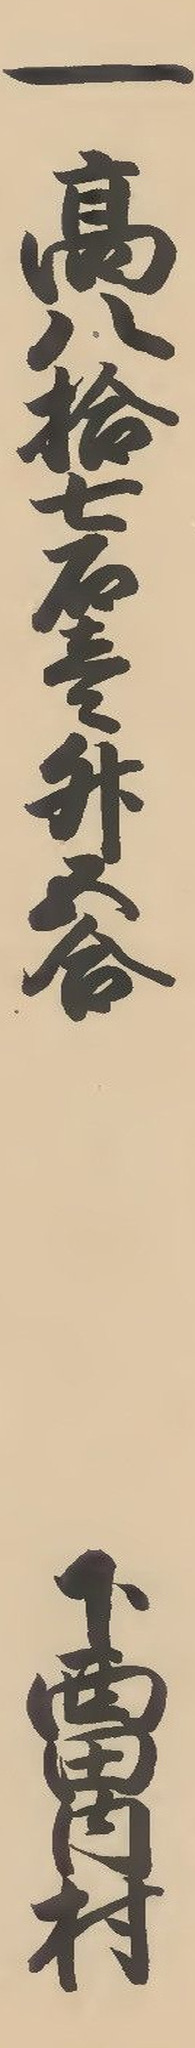一高八拾七石壱升五合下西田内村
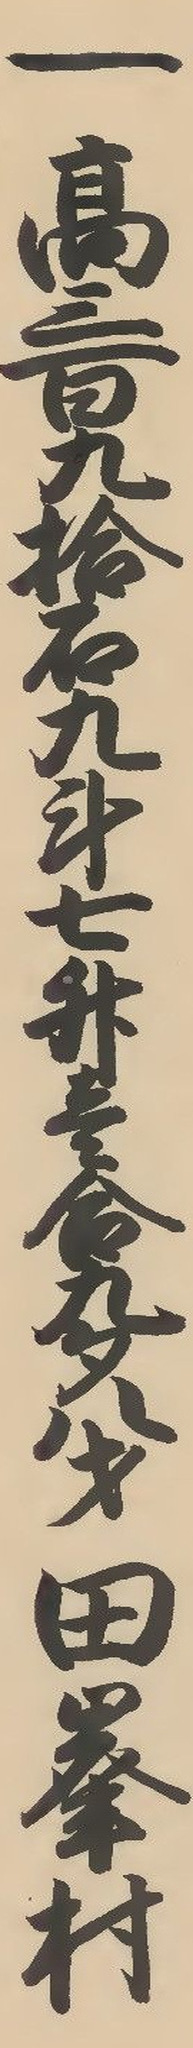一高三百九拾石九斗七升壱合九勺八才田峯村

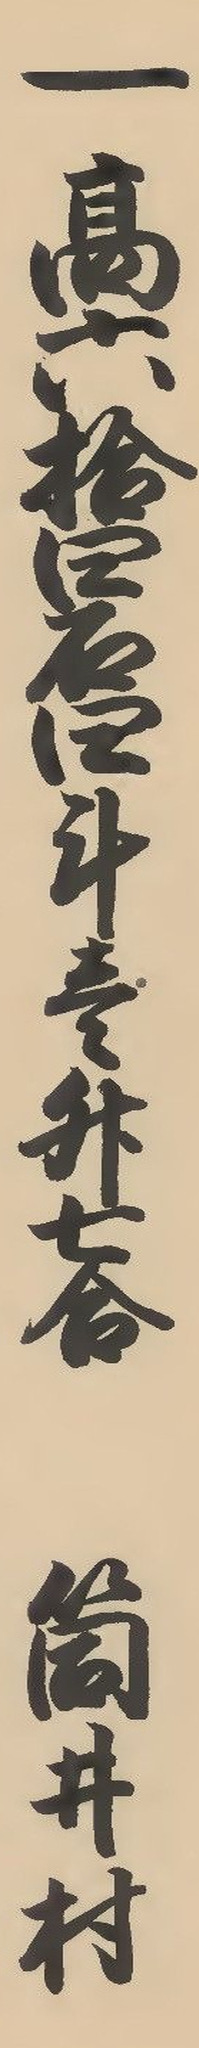一高六拾四石四斗壱升七合筒井村
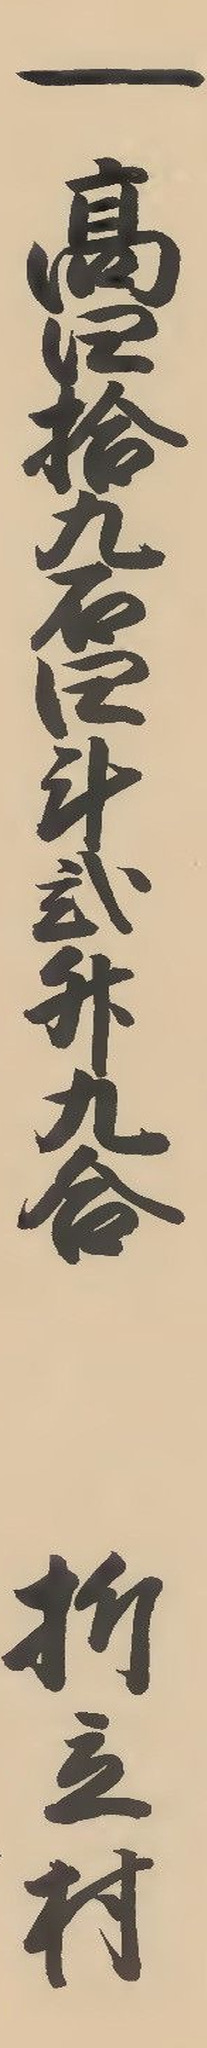一高四拾九石四斗弐升九合折立村
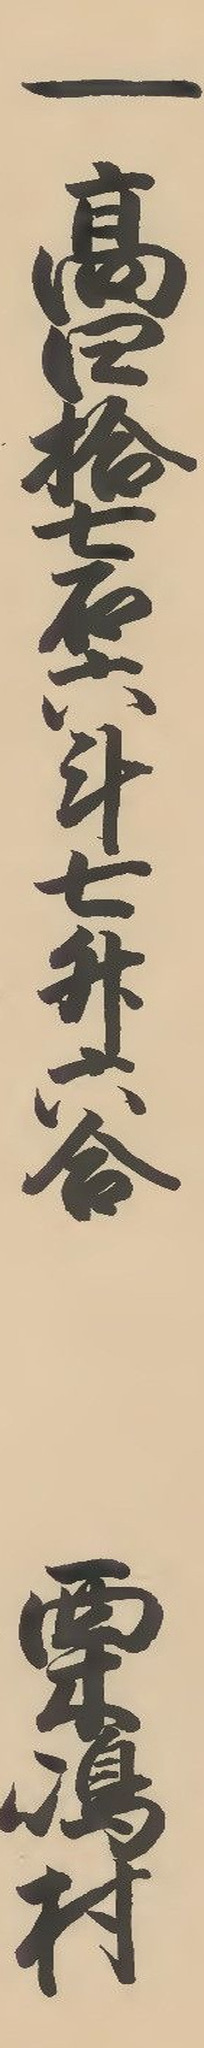一高四拾七石六斗七升六合栗島村
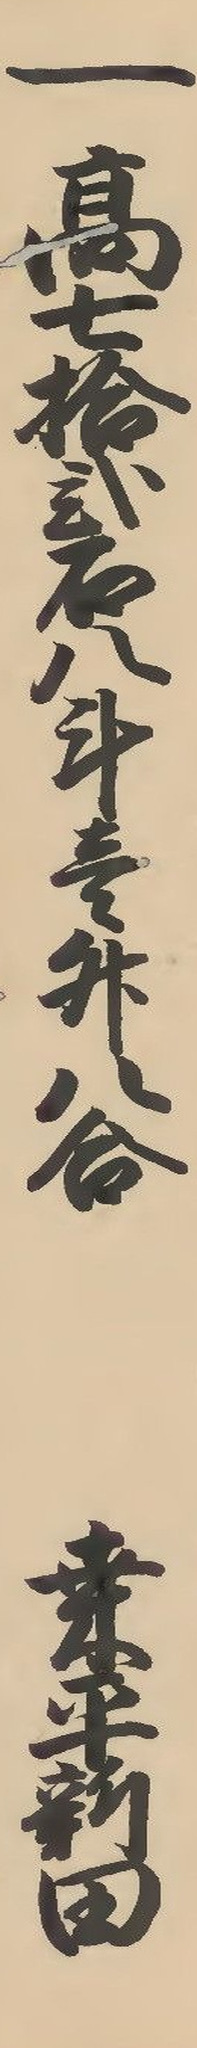一高七拾弐石八斗壱升八合桑平新田
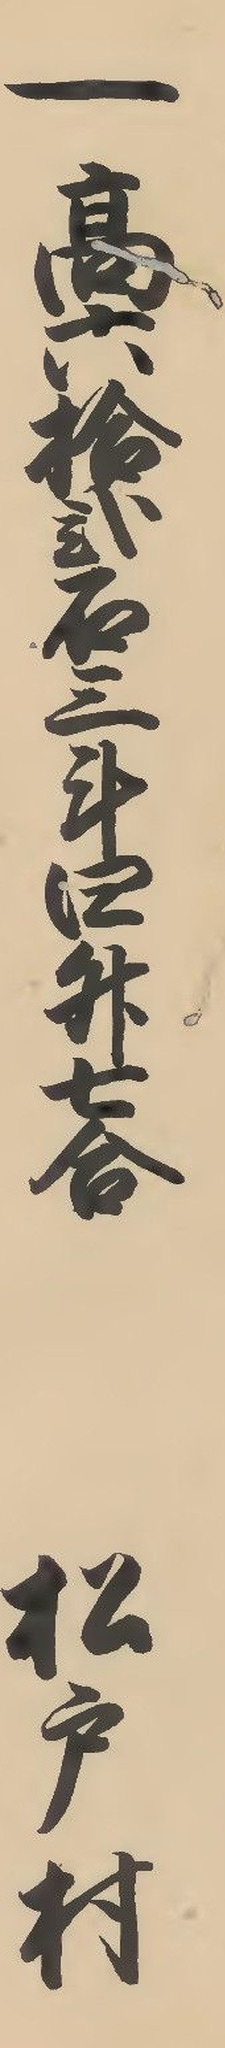一高六拾弐石三斗四升七合松戸村
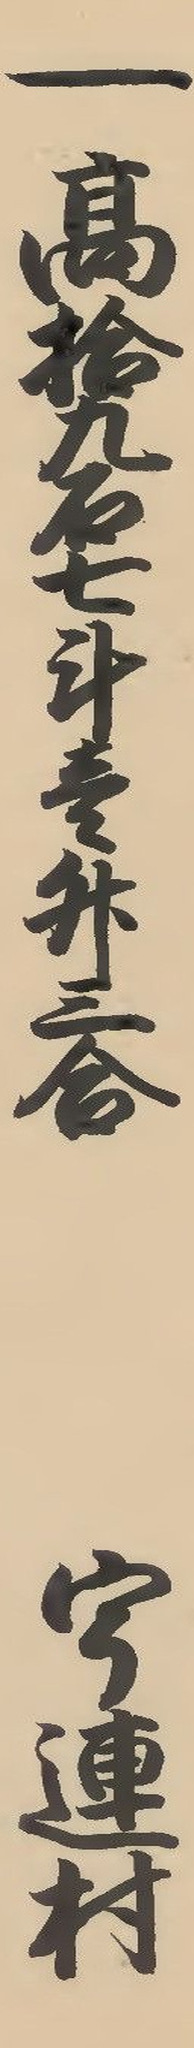一高拾九石七斗壱升三合宇連村
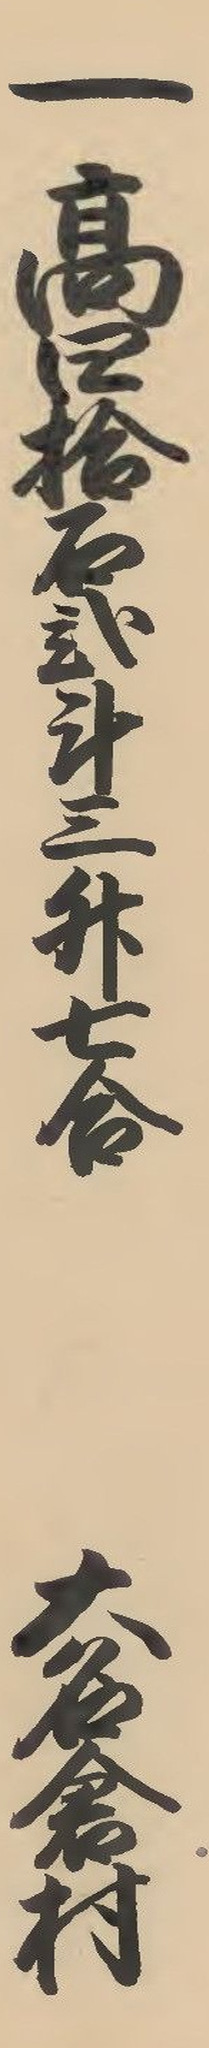一高四拾石弐斗三升七合大名倉村
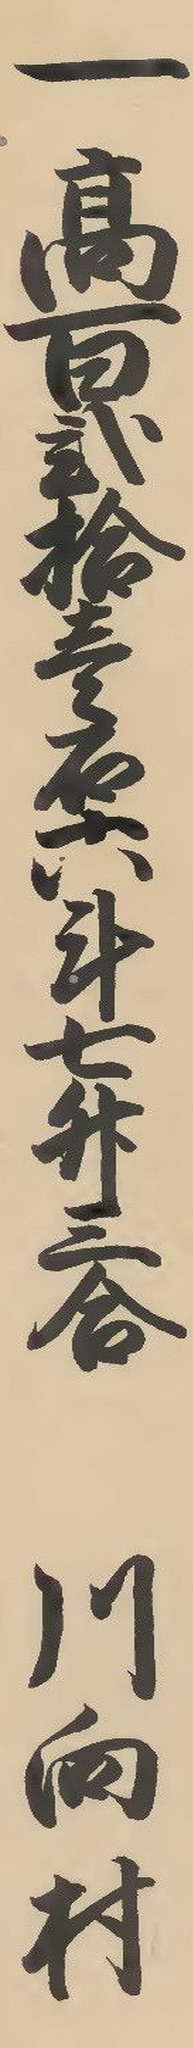一高百弐拾壱石六斗七升三合川向村
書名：三河国郷帳
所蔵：国立公文書館 National Archives of Japan
